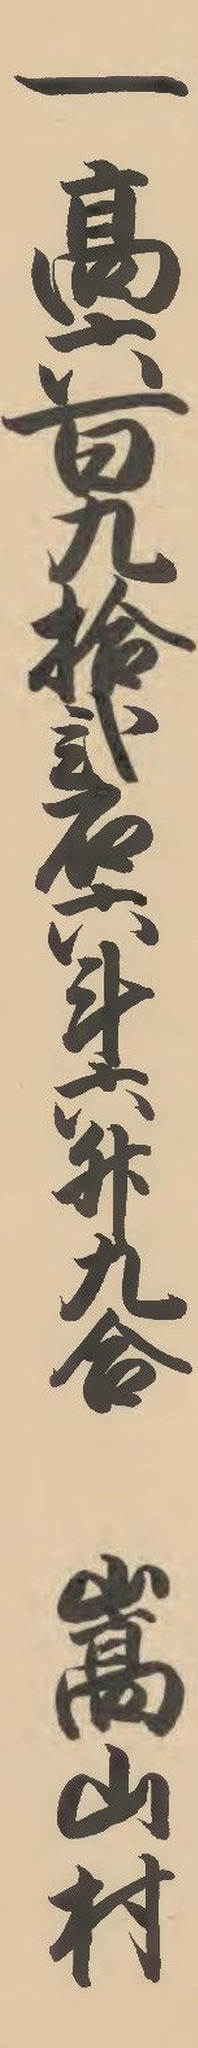一高六百九拾弐石六斗六升九合嵩山村
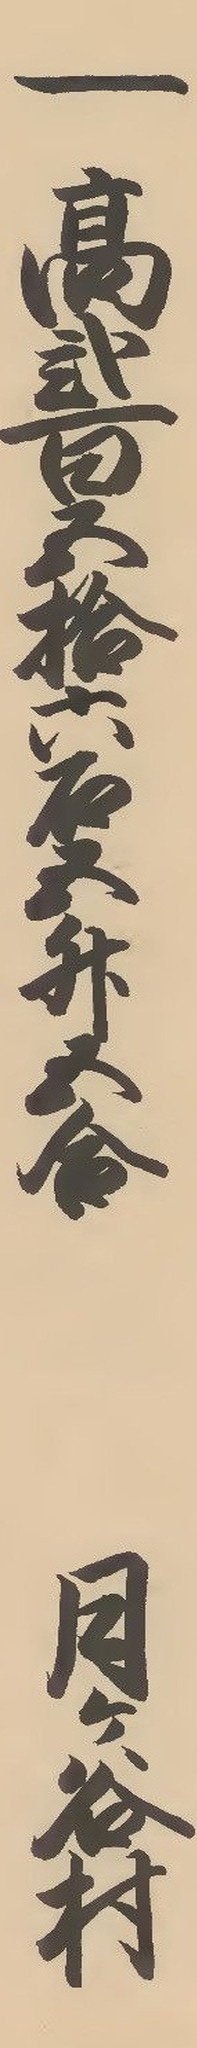一高弐百五拾六石五升五合月ヶ谷村
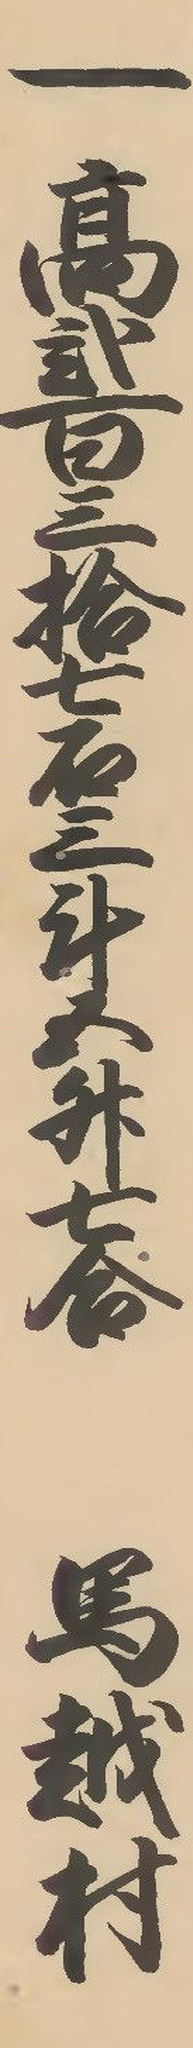一高弐百三拾七石三斗五升七合馬越村

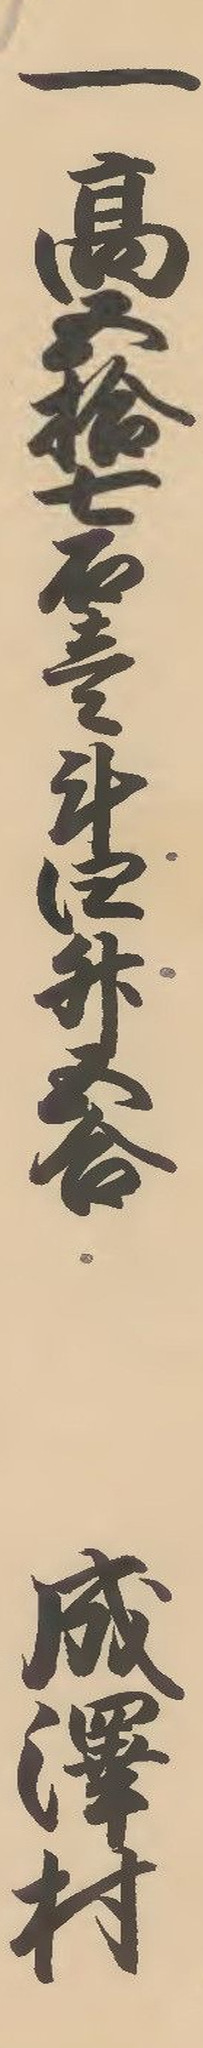一高五拾七石壱斗四升五合成沢村
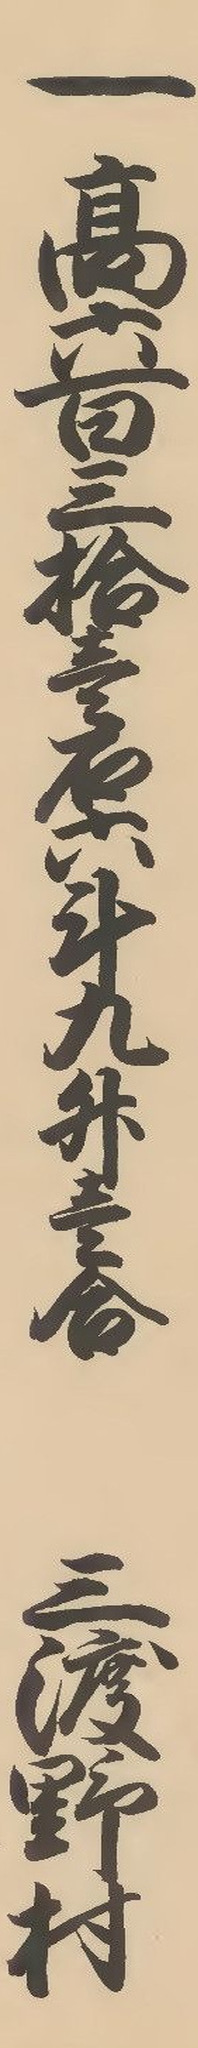一高六百三拾壱石六斗九升壱合三渡野村
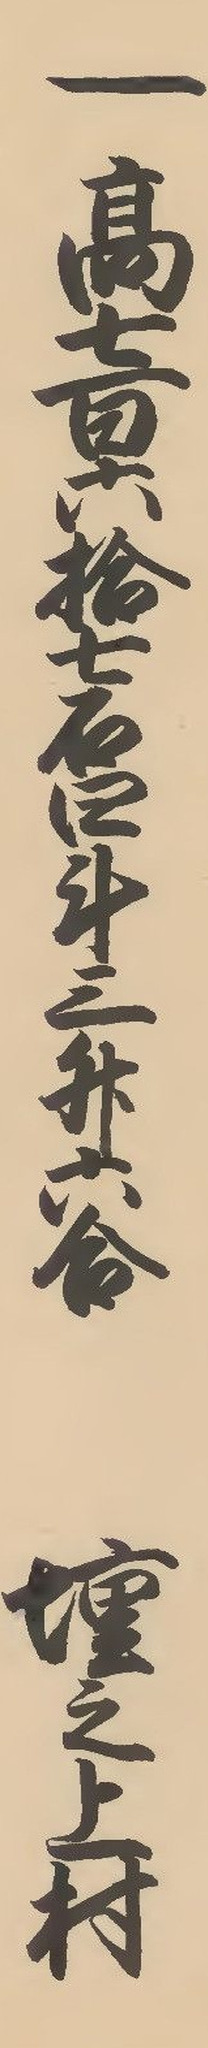一高七百六拾七石四斗三升六合壇之上村
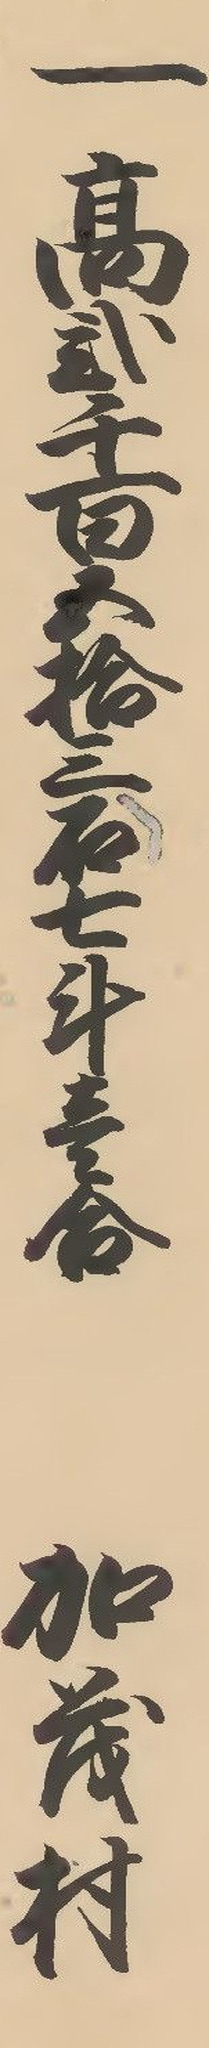一高弐千百五拾三石七斗壱合加茂村
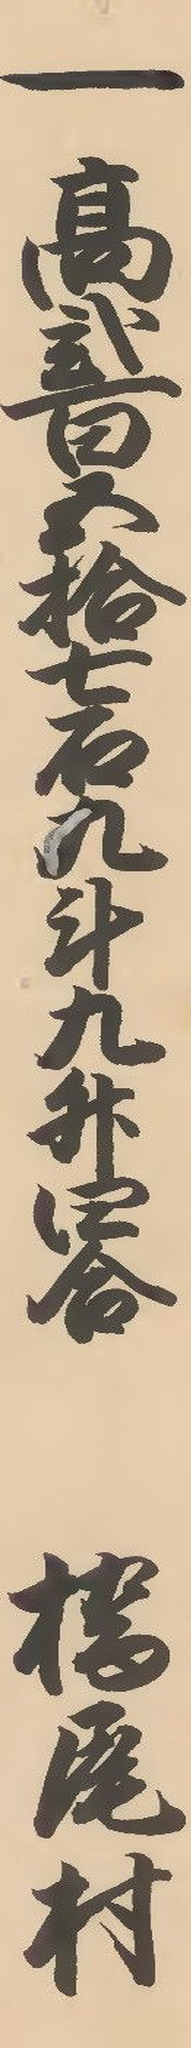一高弐百五拾七石九斗九升四合橋尾村
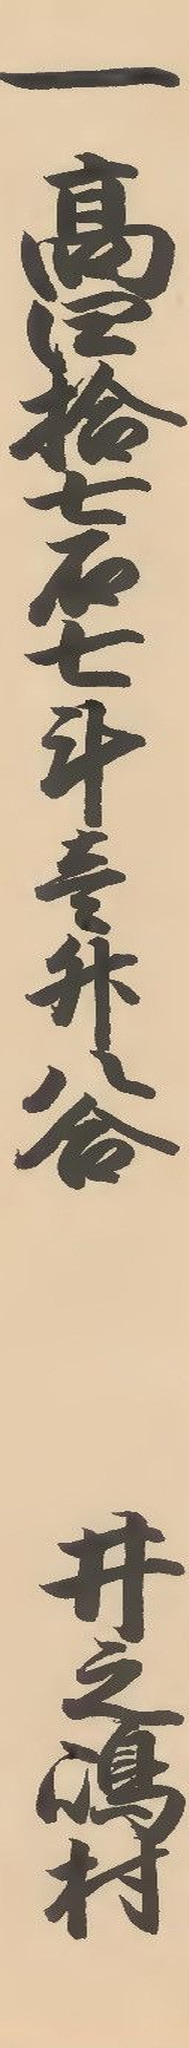一高四拾七石七斗壱升八合井之島村
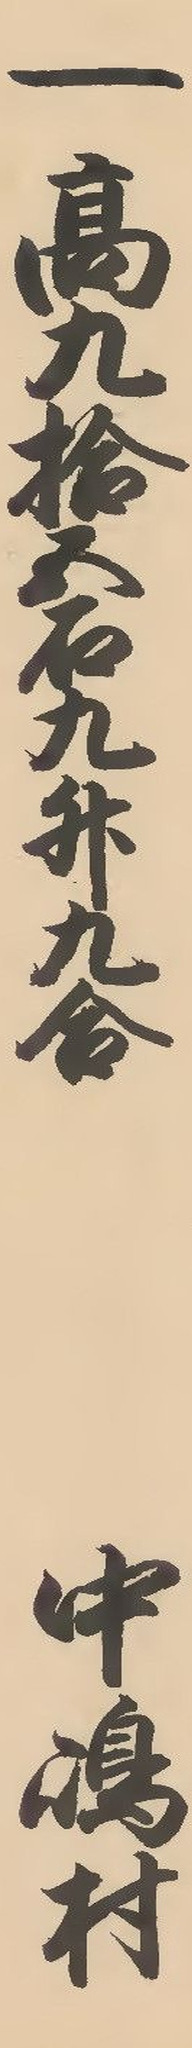一高九拾五石九升九合中島村
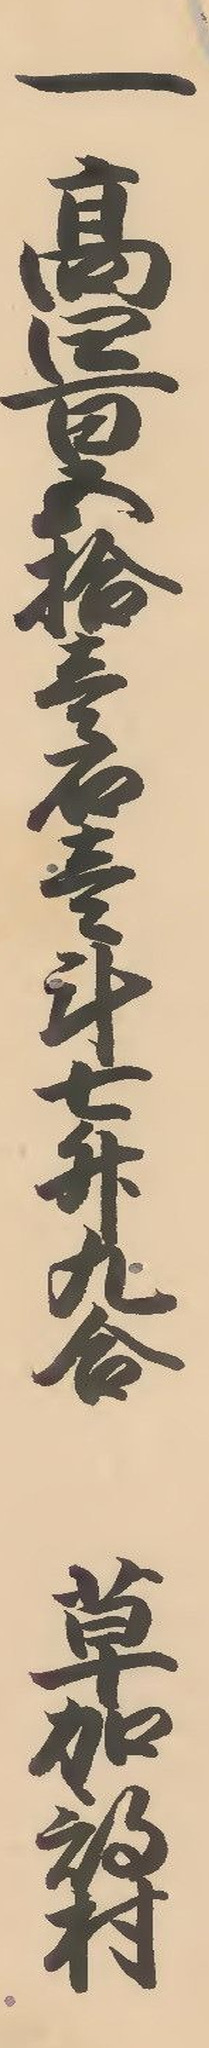一高四百五拾壱石壱斗七升九合草加部村

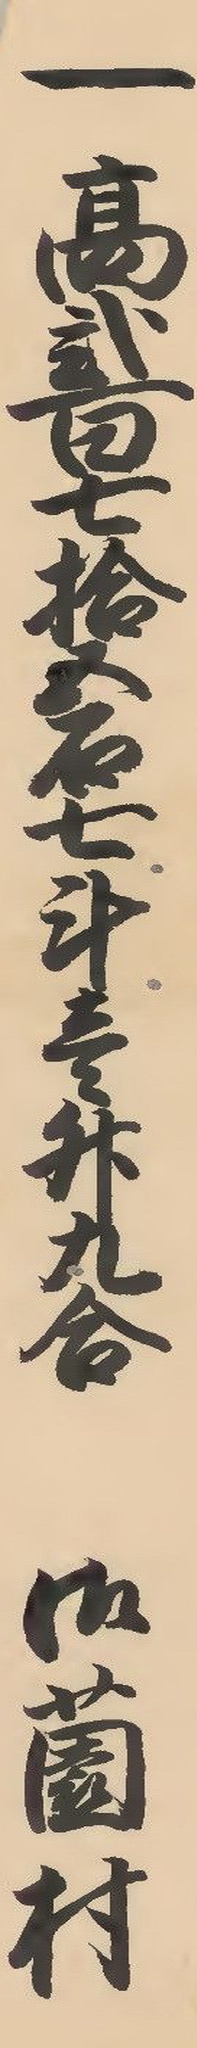一高弐百七拾五石七斗壱升九合御薗村
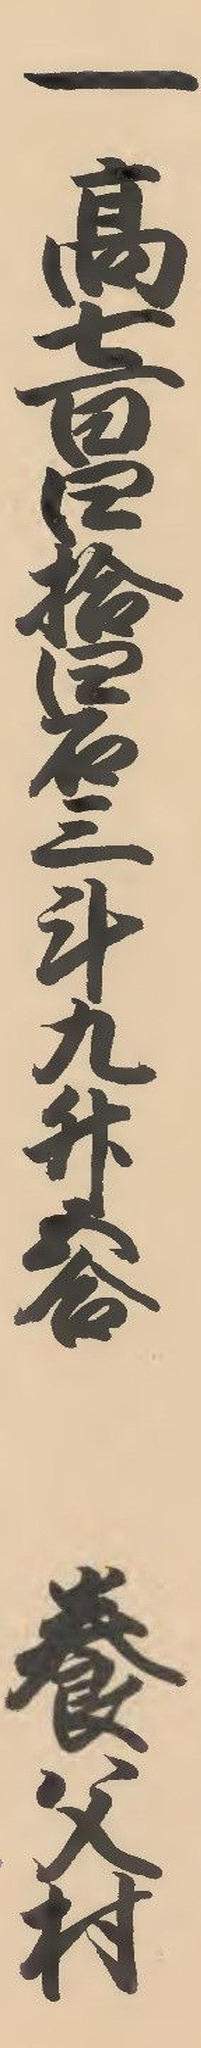一高七百四拾四石三斗九升五合養父村
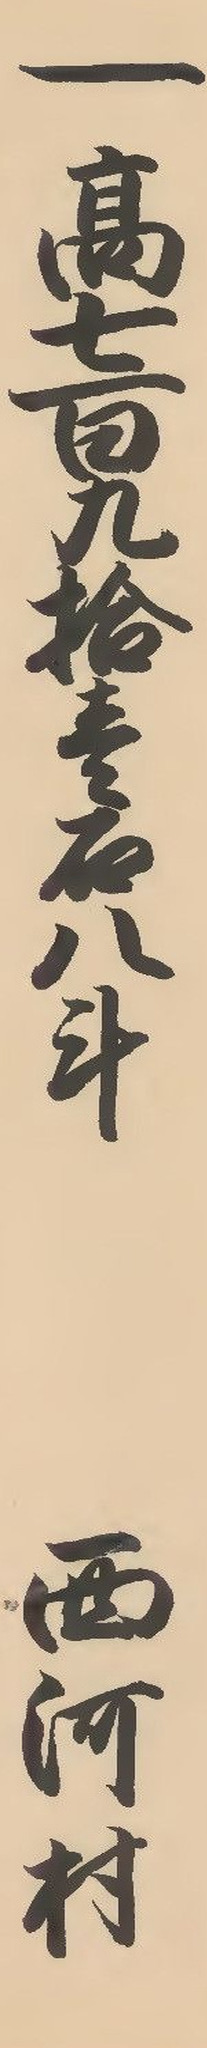一高七百九拾壱石八斗西河村
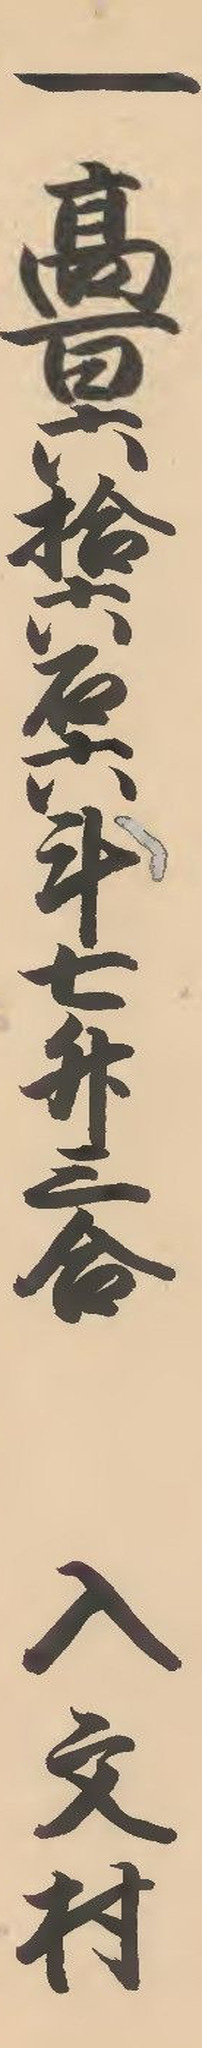一高百六拾六石六斗七升三合入文村
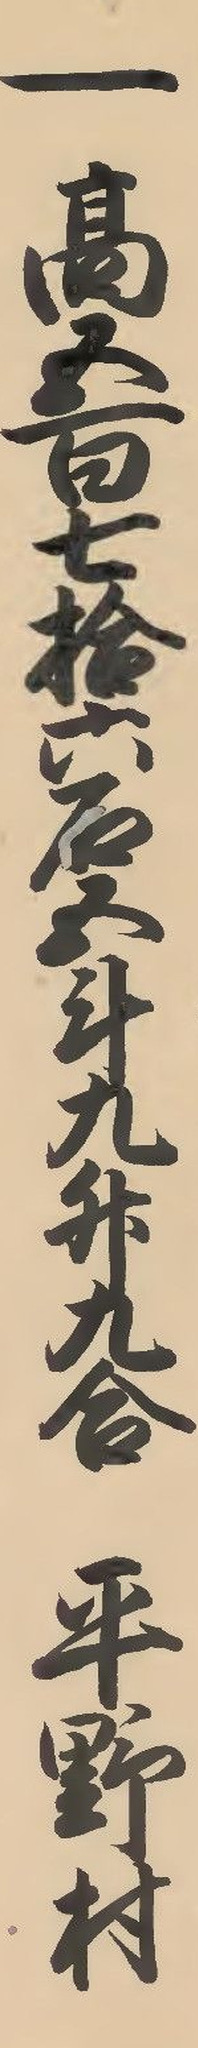一高五百七拾六石五斗九升九合平野村
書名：三河国郷帳
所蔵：国立公文書館 National Archives of Japan
